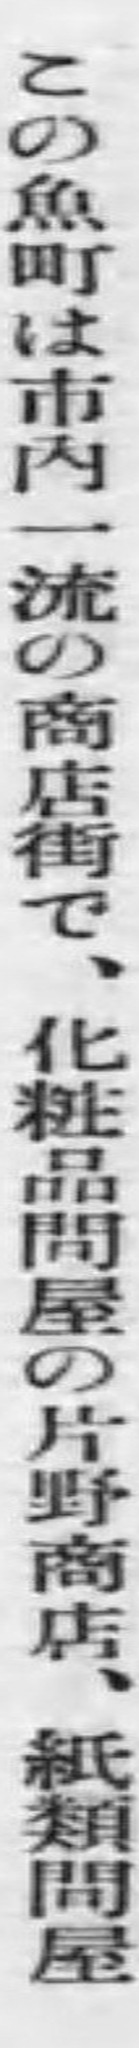この魚町は市内一流の商店街で、化粧品問屋の片野商店、紙類問屋
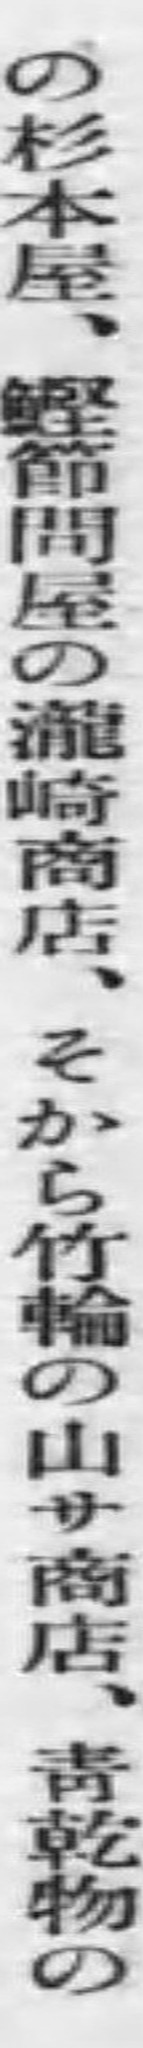の杉本屋、鰹節問屋の瀧崎商店、そから竹輪の山サ商店、青乾物の
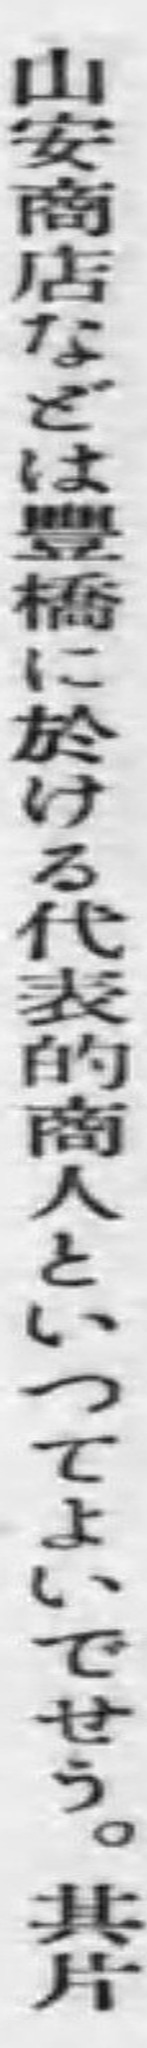山安商店などは豊橋に於ける代表的商人といつてよいでせう。其片

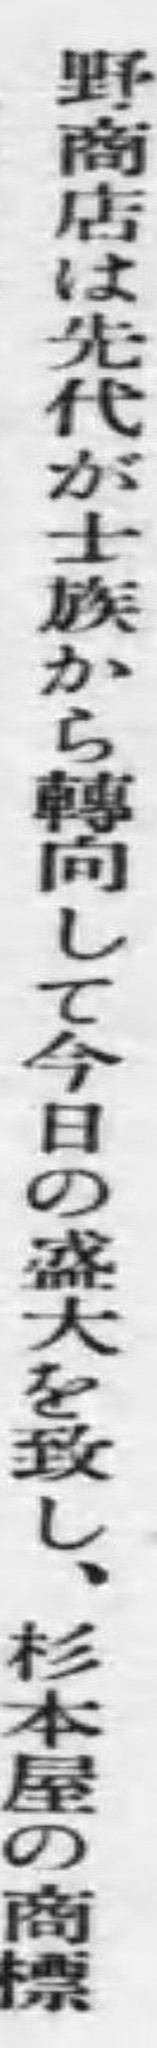野商店は先代が士族から転向して今日の盛大を致し、杉本屋の商標
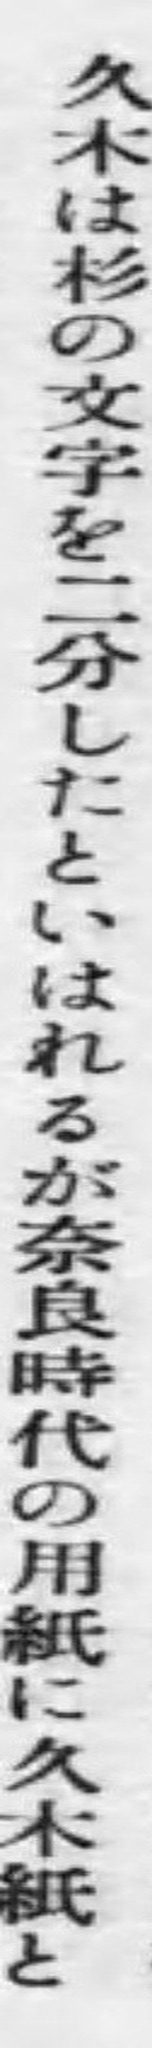久木は杉の文字を二分したといはれるが奈良時代の用紙に久木紙と
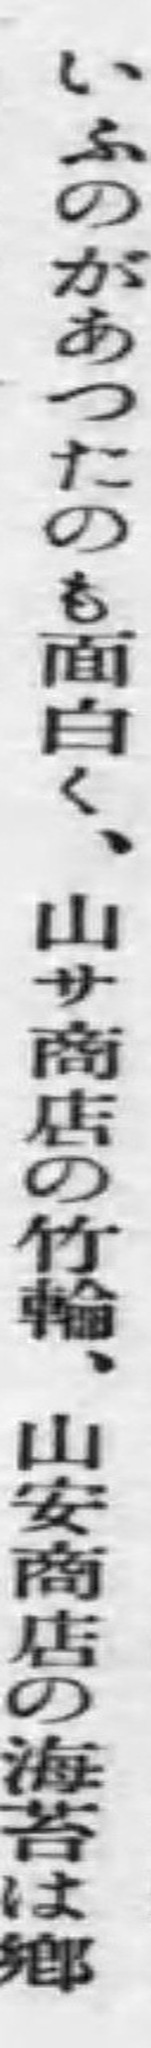いうのがあつたのも面白く、山サ商店の竹輪、山安商店の海苔は郷
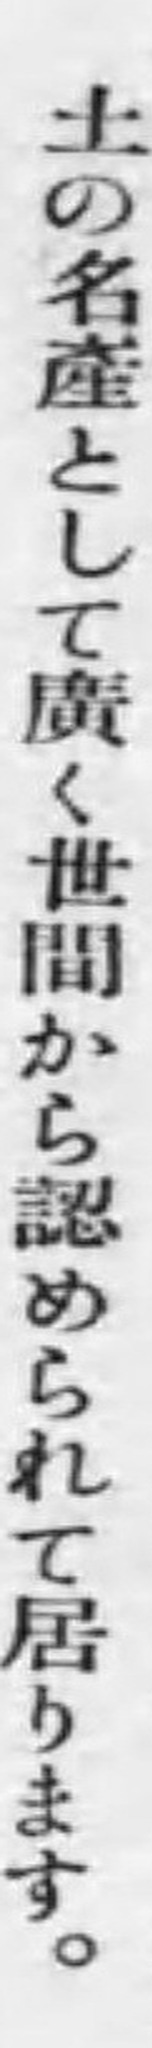土の名産として広く世間から認められて居ります。
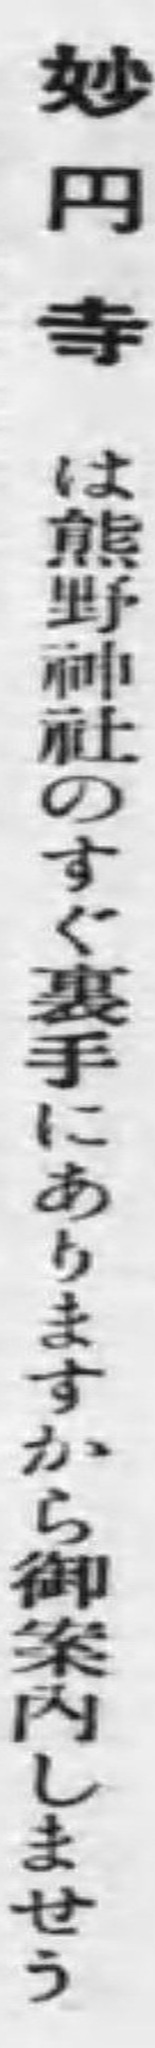妙円寺は熊野神社のすぐ裏手にありますから御案内しませう
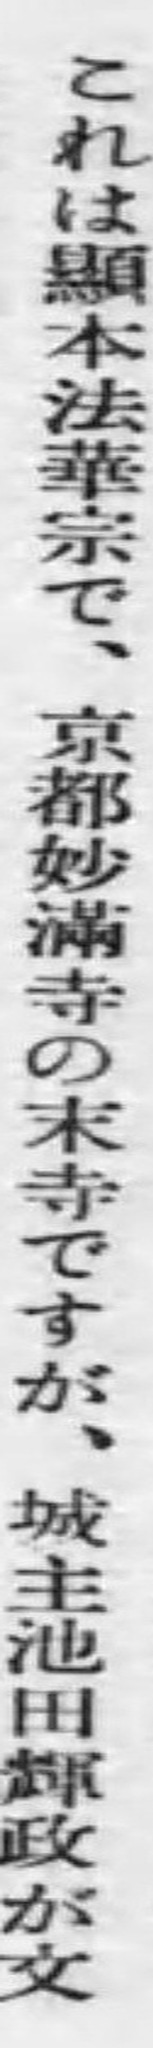これは顕本法華宗で、京都妙満寺の末寺ですが、城主池田輝政が文
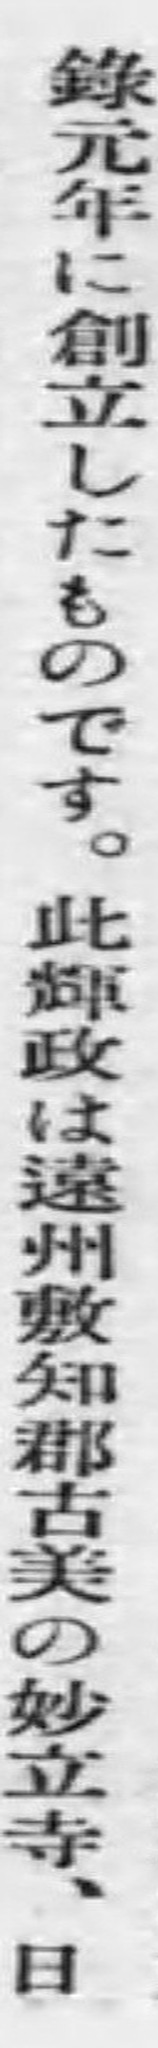録元年に創立したものです。此輝政は遠州敷知郡古美の妙立寺、日
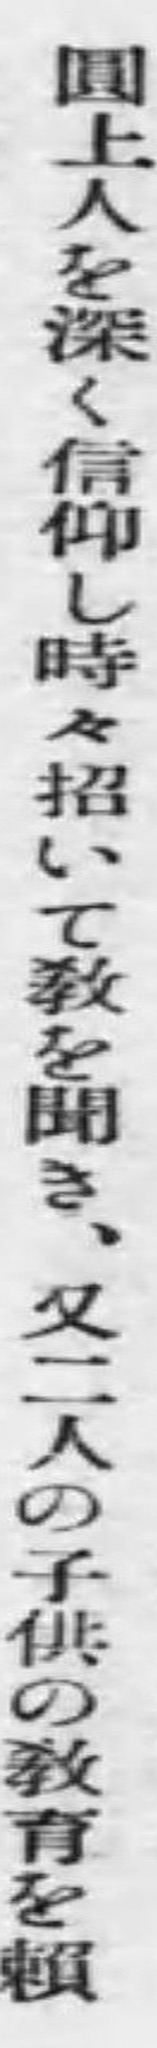円上人を深く信仰し時々招いて教を聞き、又二人の子供の教育を頼
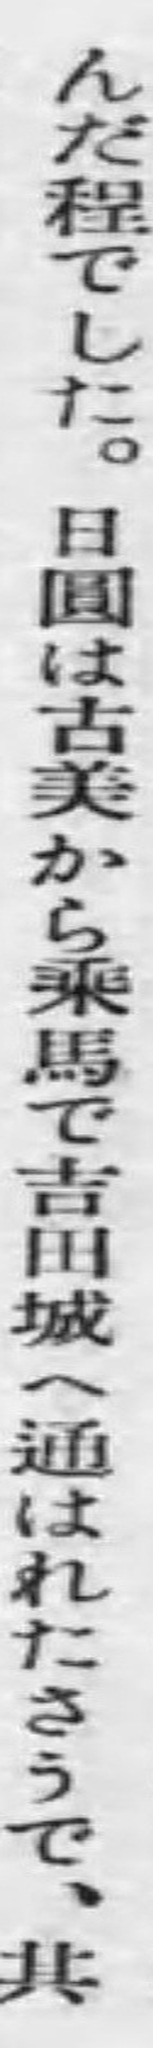んだ程でした。日円は古美から乗馬で吉田城へ通はれたさうで、其
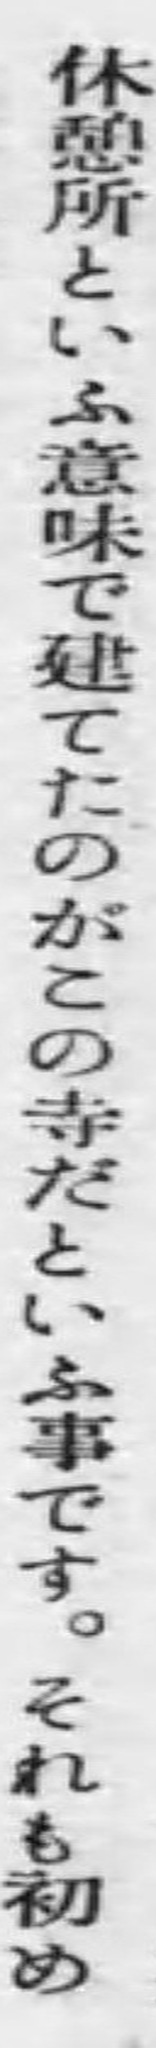休憩所といふ意味で建てたのがこの寺だといふ事です。それも初め
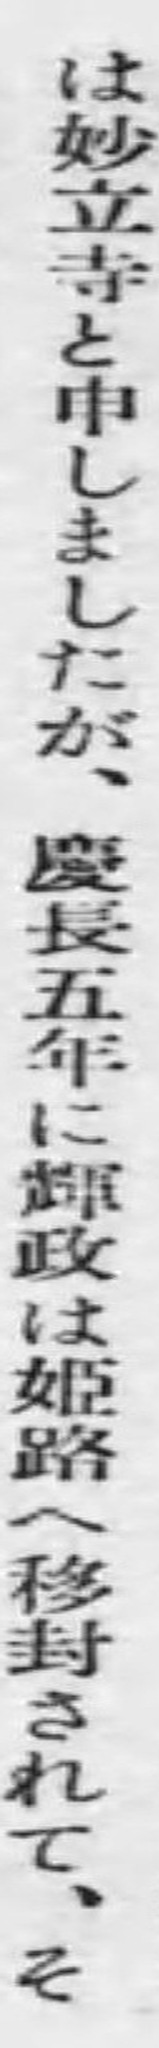は妙立寺と申しましたが、慶長五年に輝政は姫路へ移封されて、そ
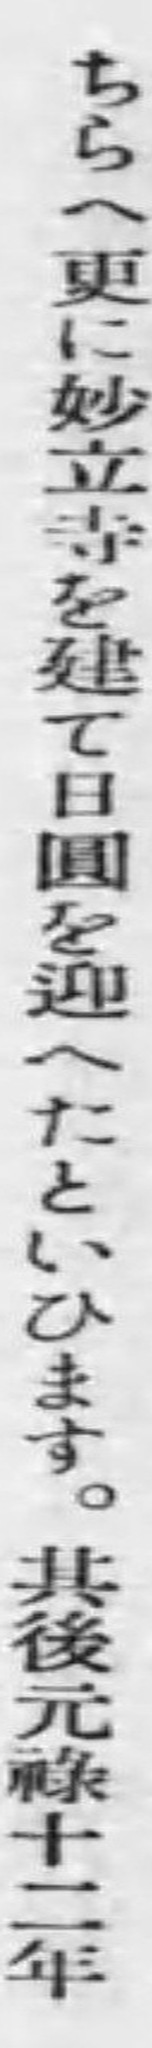ちらへ更に妙立寺を建て日円を迎へたといひます。其後元禄十二年
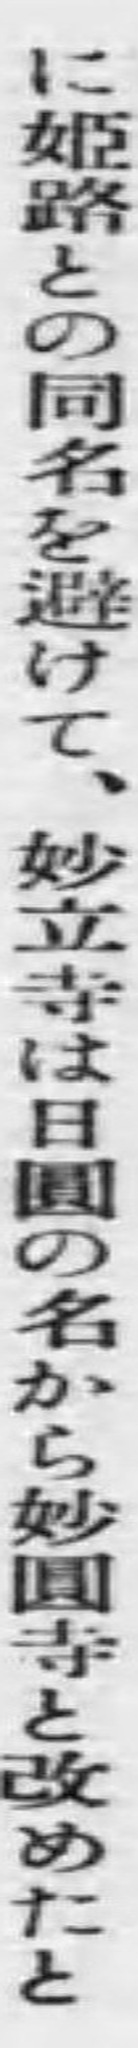に姫路との同名を避けて、妙立寺は日円の名から妙円寺と改めたと
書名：東三河道中記 : 豊橋市及其附近案内
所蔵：国立国会図書館 National Diet Library, JAPAN
